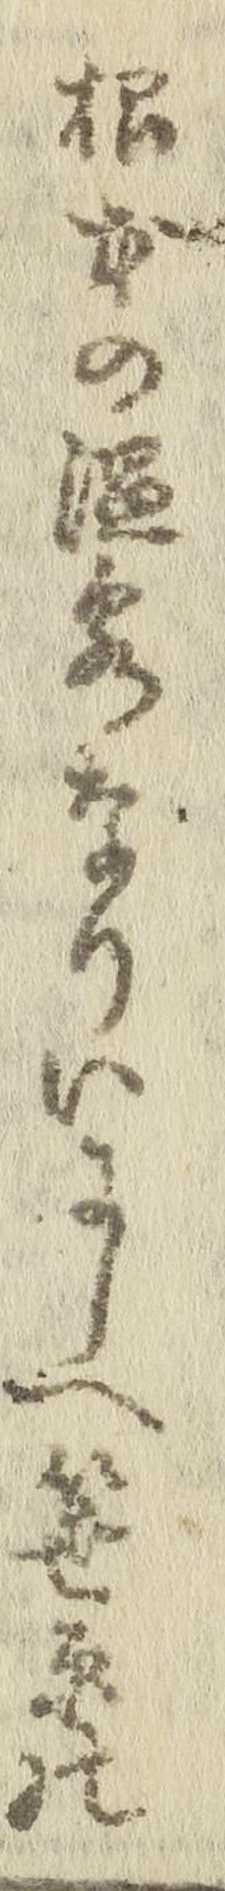根本の温泉なりいにしへ笹原の
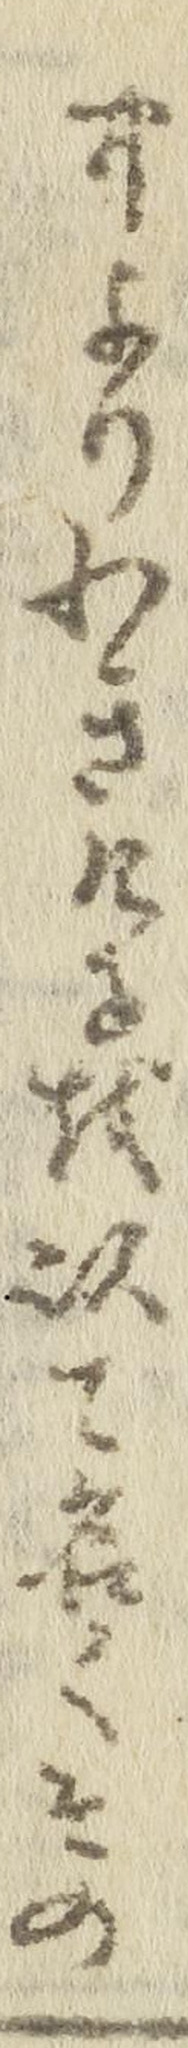中よりわきけるを以て名くその
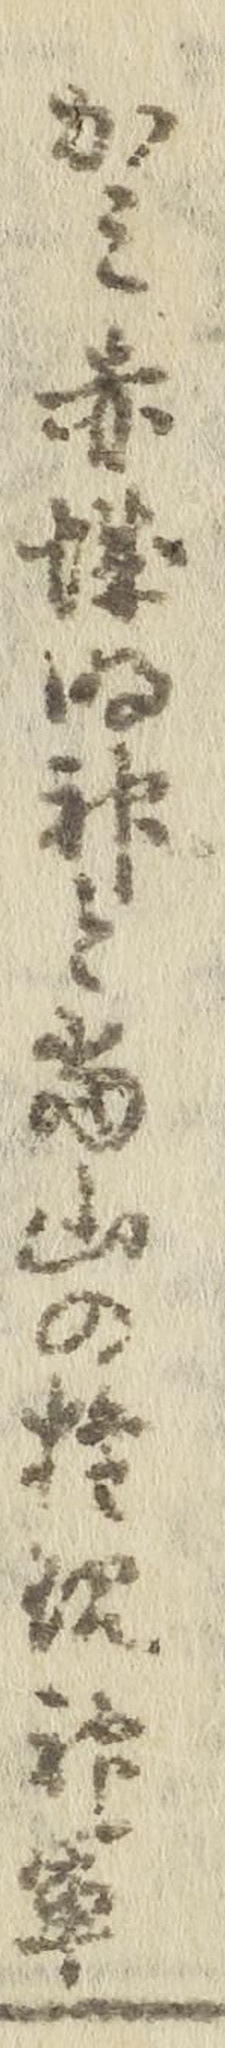かみ赤城明神と当山の権現神軍
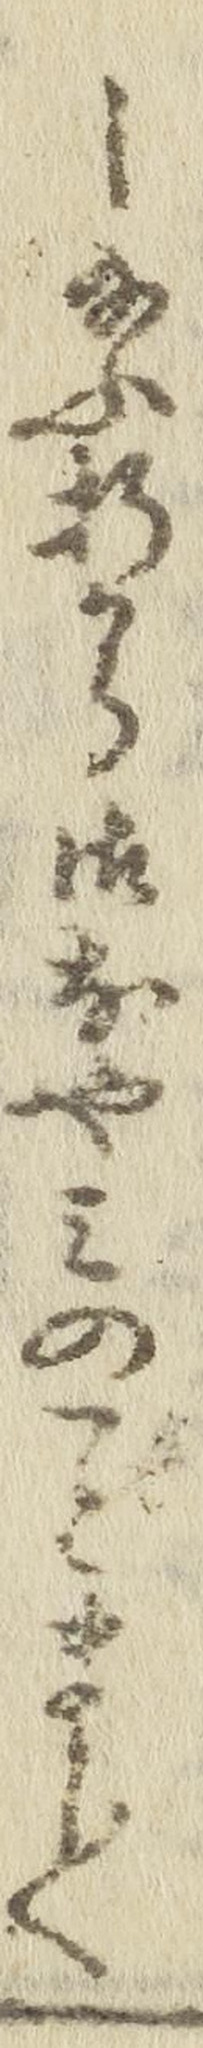し給ふ折から御なやみのことまし〳〵
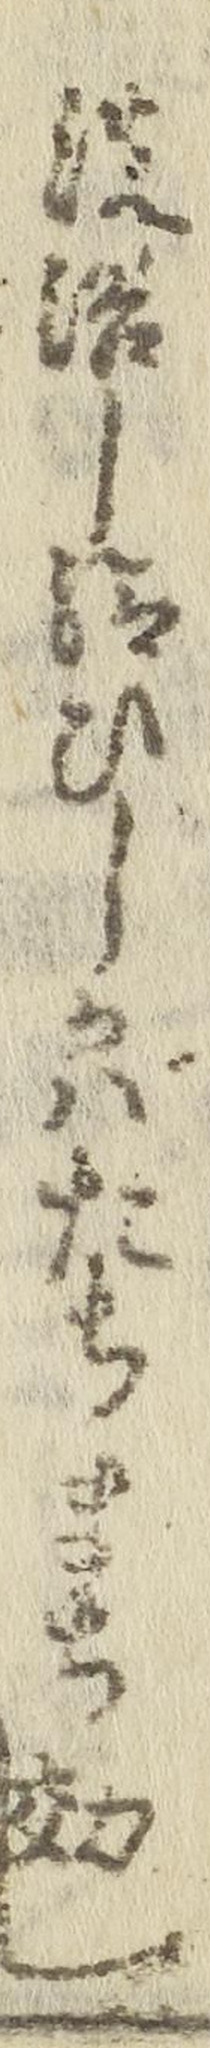洗浴し給ひしかばたちまち効し
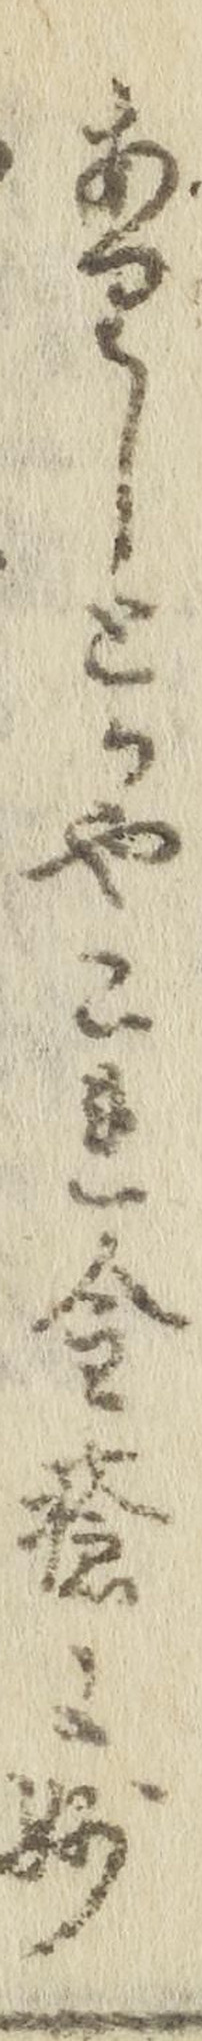ありしとかやこれ金瘡に妙
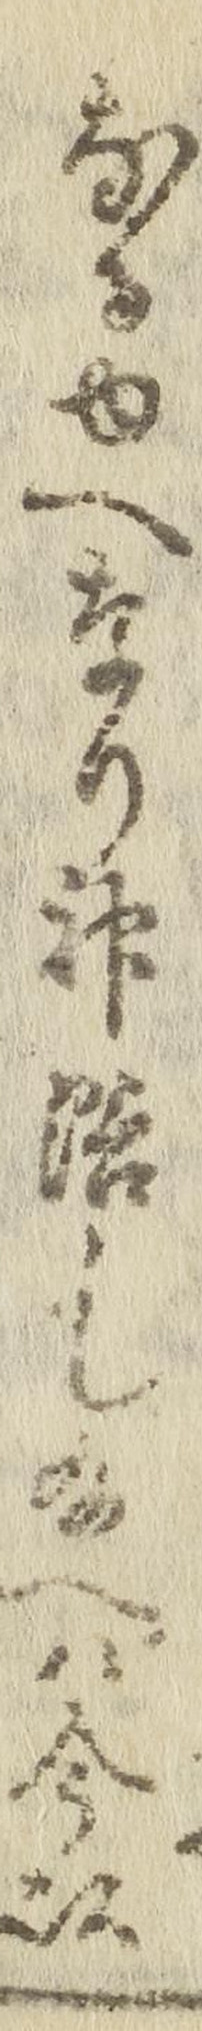なるゆへなり神浴し給へは今以
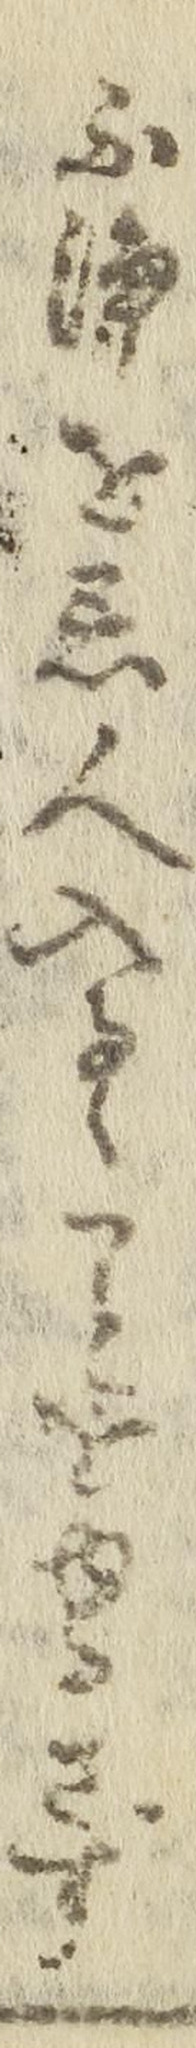不浄を忌人入ることをゆるさず
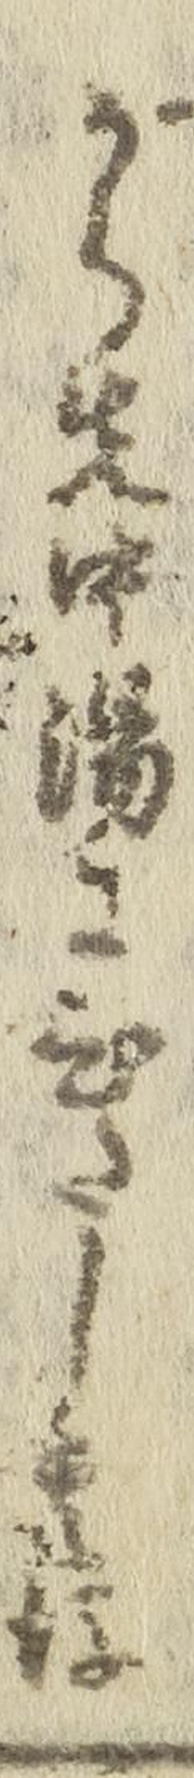がら先中湯にひたし其後
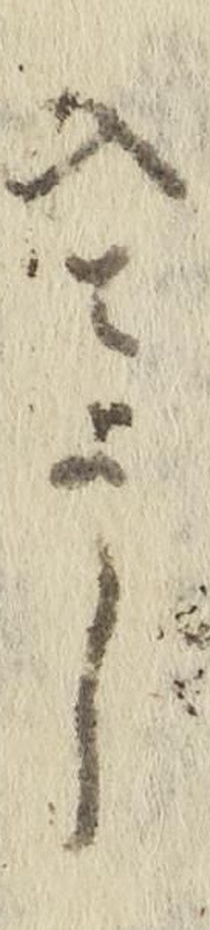入てよし
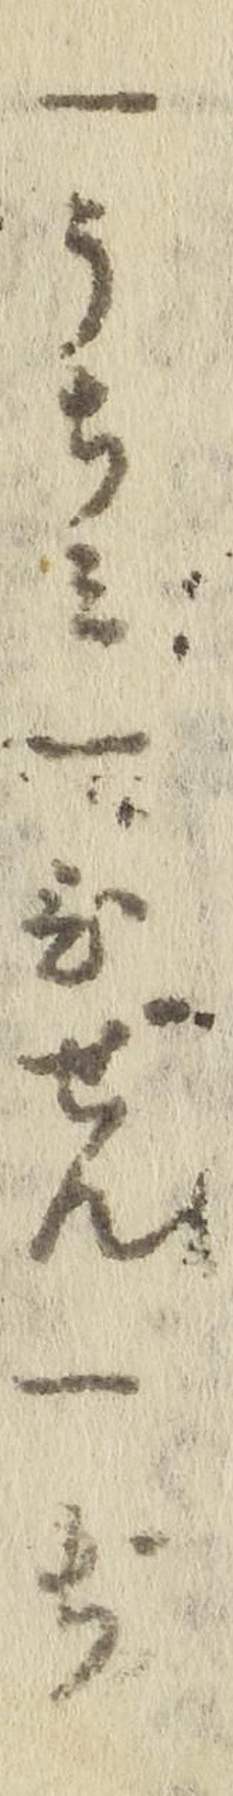一うちみ一ひぜん一ぢ
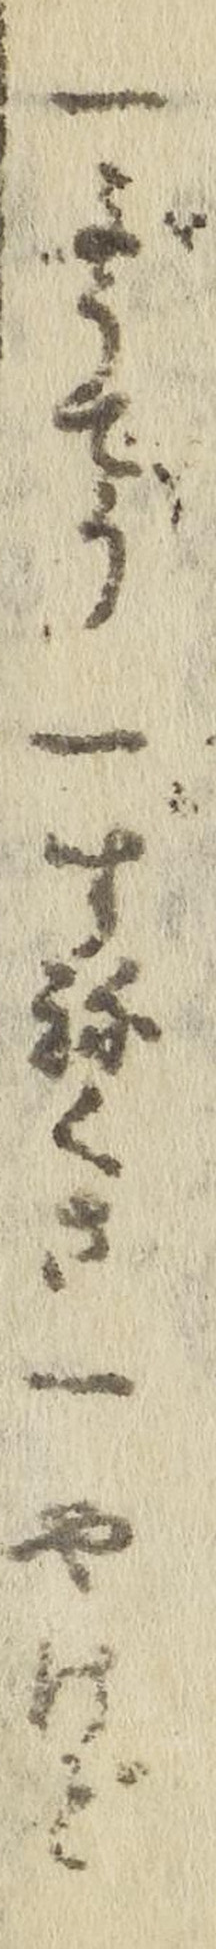一ようてう一すねくさ一やけど

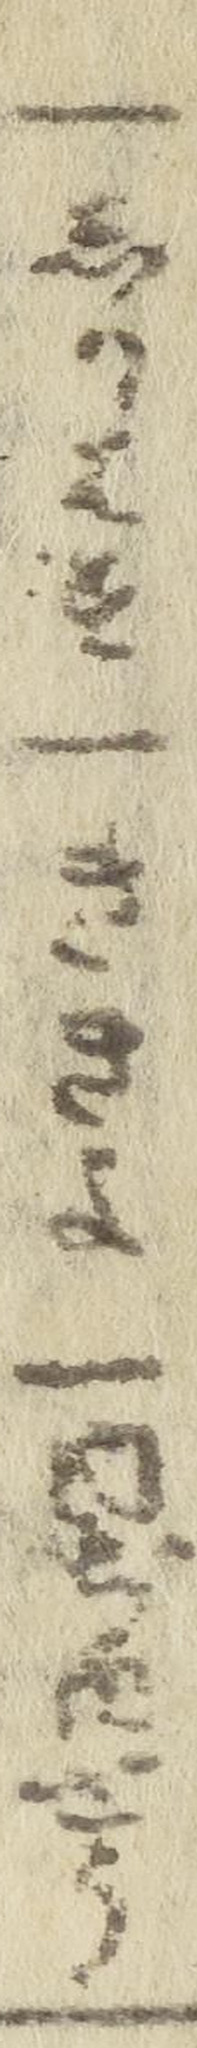一しりはす一ききよ一内ぢ内せう
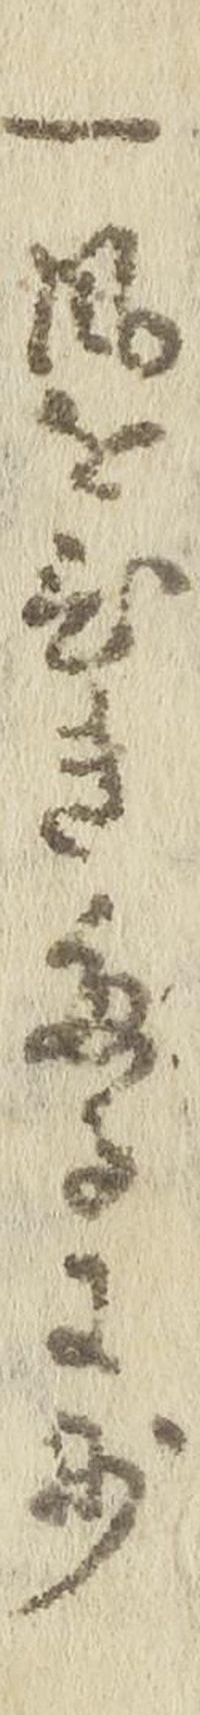一風をひきたるに妙
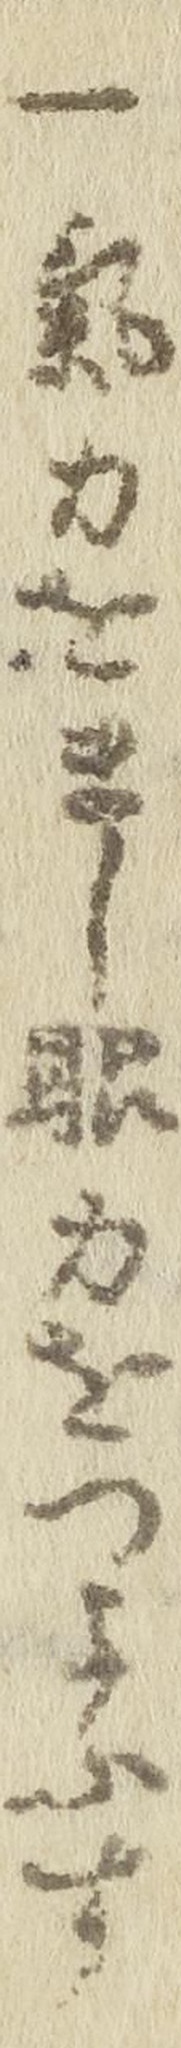一気力をまし眼力をつよふす
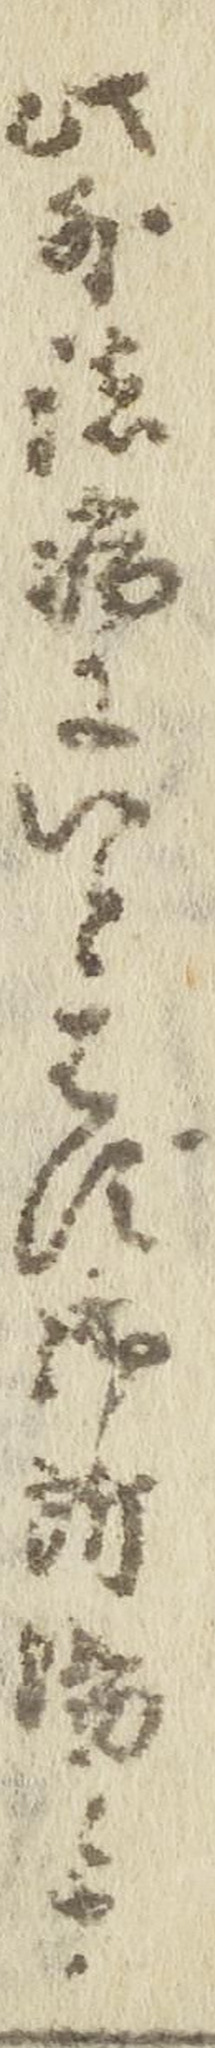此外諸病にいとはず御所湯と申
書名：日光山中禅寺　温泉記　全
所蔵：東京大学地震研究所図書室 Earthquake Research Institute Library, The University of Tokyo, JAPAN
